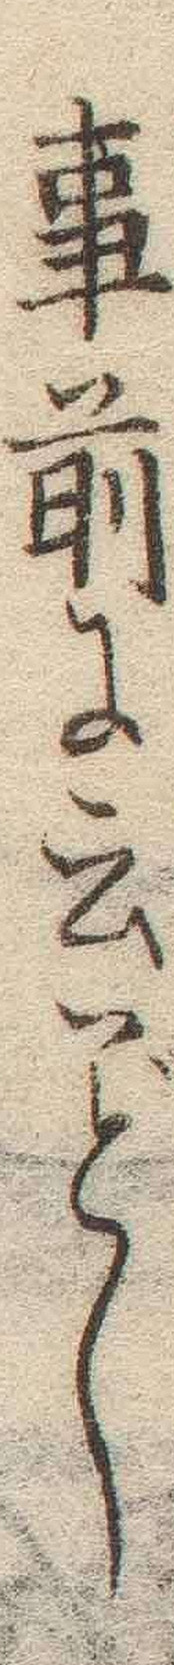事前に云ごとし
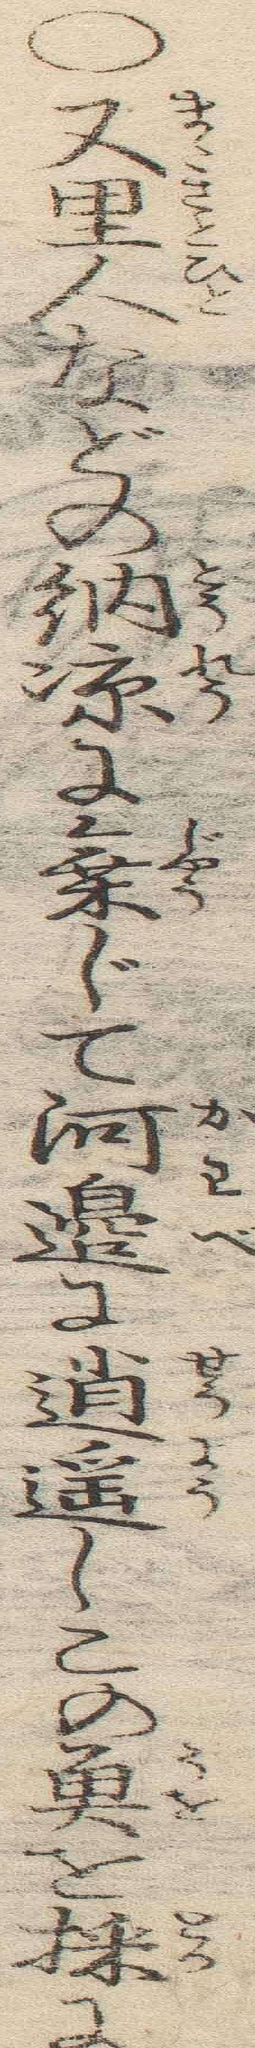○又里人などの納涼に乗じて河辺に逍遥しこの魚を採に
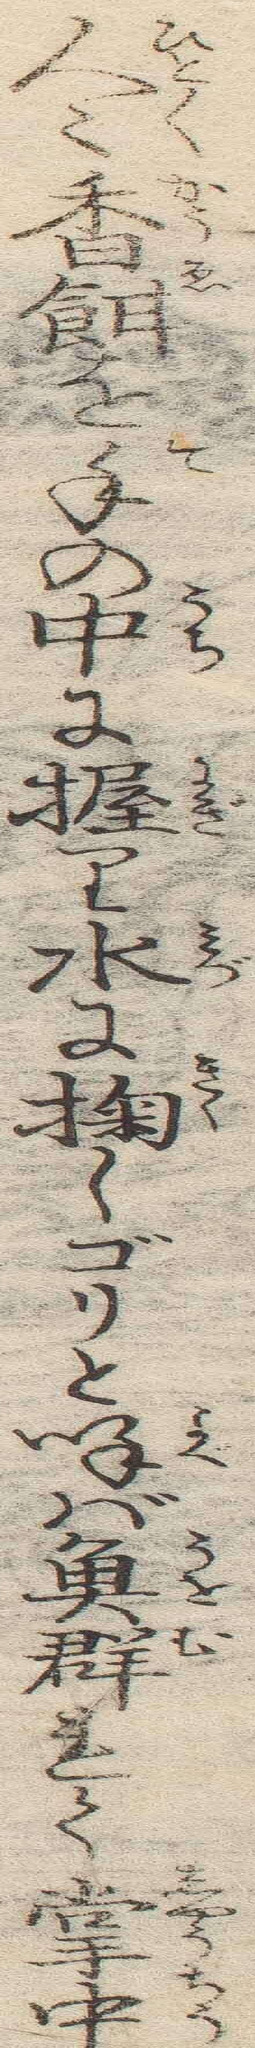人々香餌を手の中に握り水に掬しゴリと呼ば魚群れて掌中
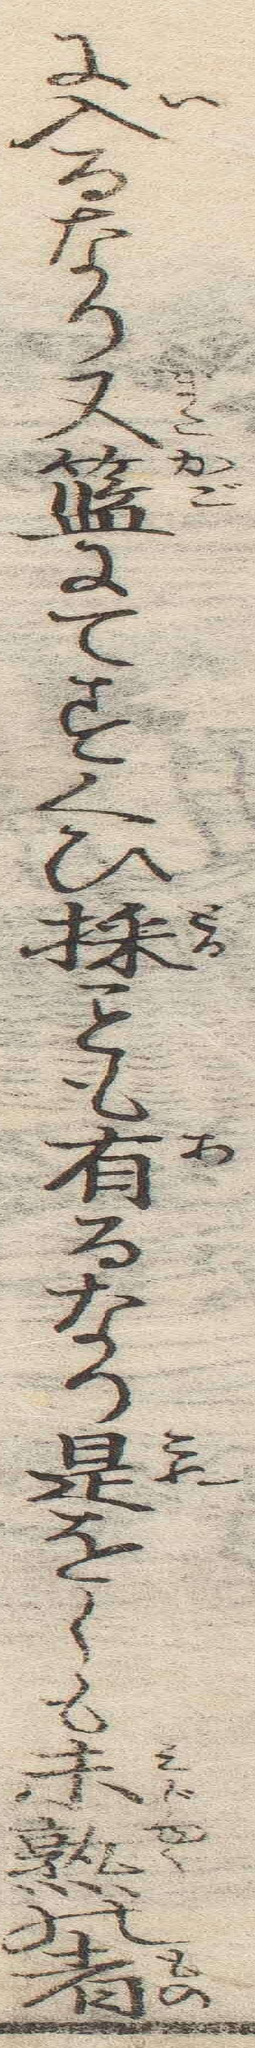に入るなり又籃にてすくひ採ことも有るなり是をしも未熟の者
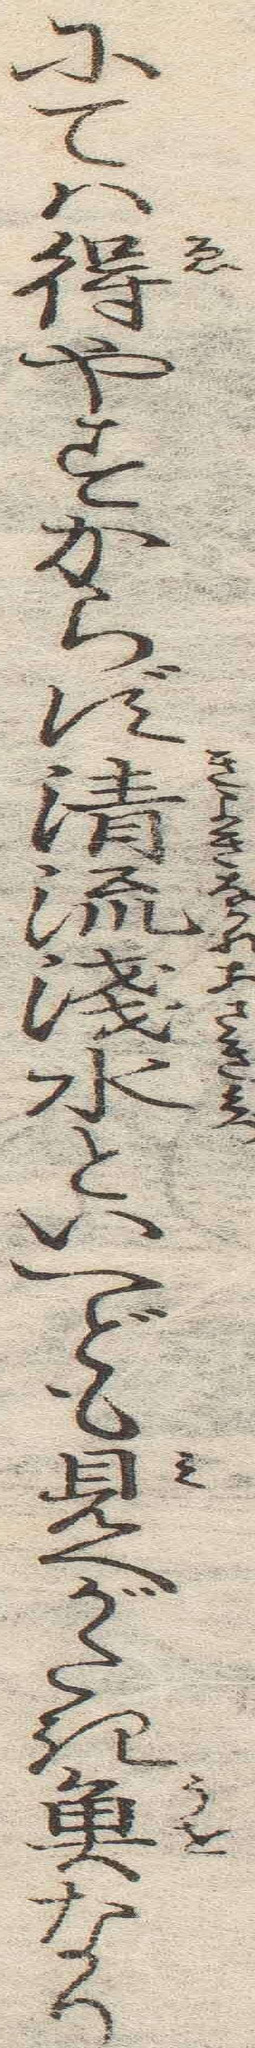にては得やすからず清流浅水といへども見へがたき魚なり
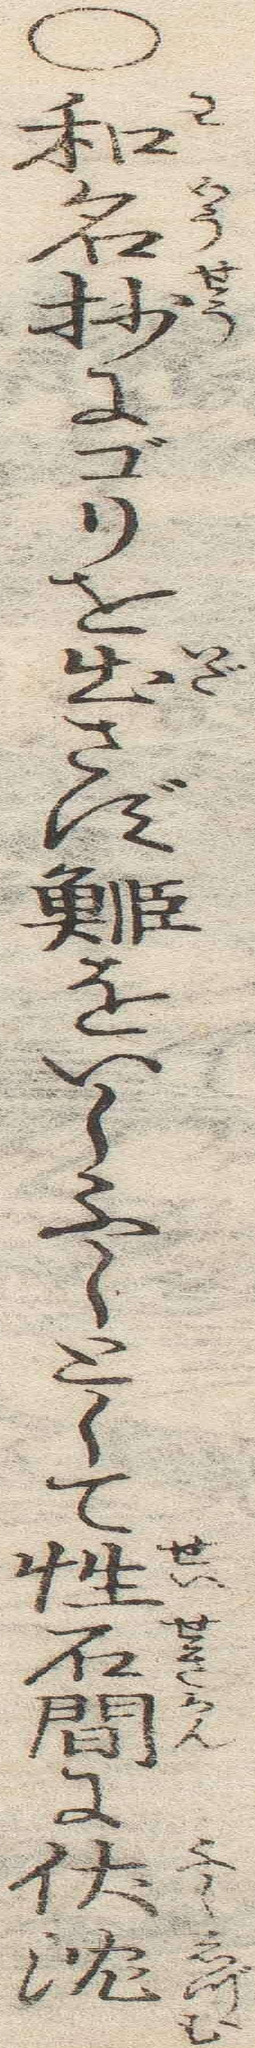○和名抄にゴリを出さず䱌をいしふしとして性石間に伏沈
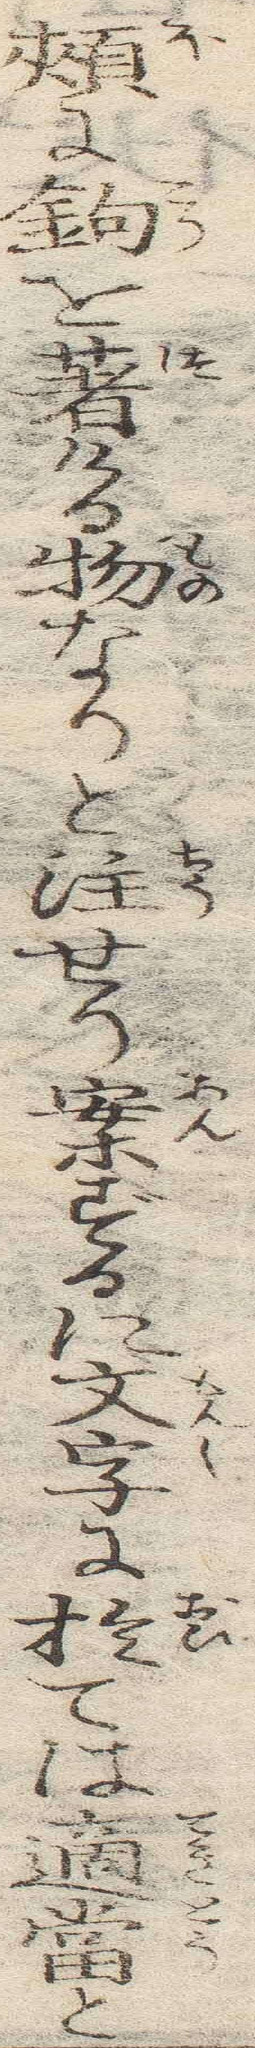頬に鉤を著ける物なりと注せり案ずるに文字に於ては適当と
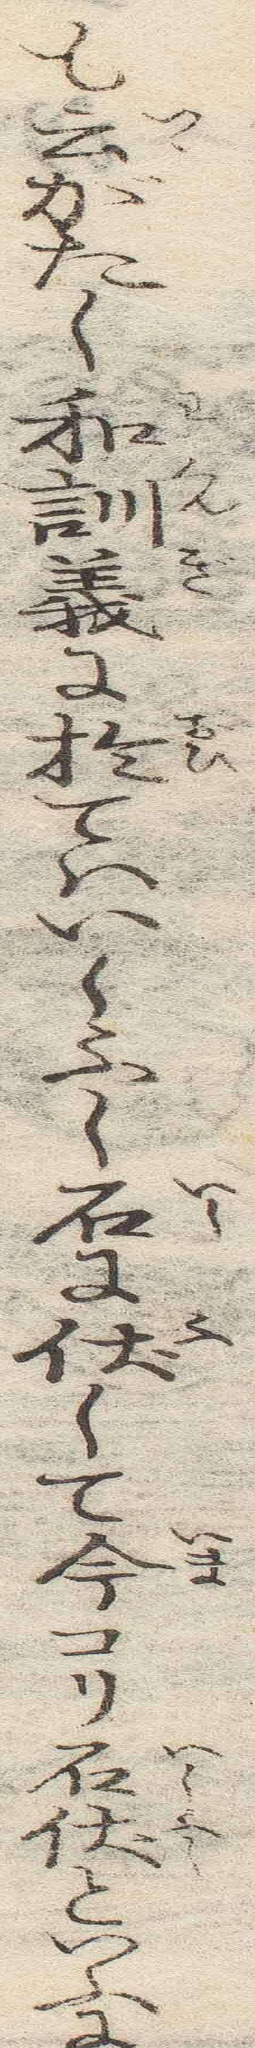も云がたし和訓義に於てはいしふし石に伏して今コリ石伏といふに
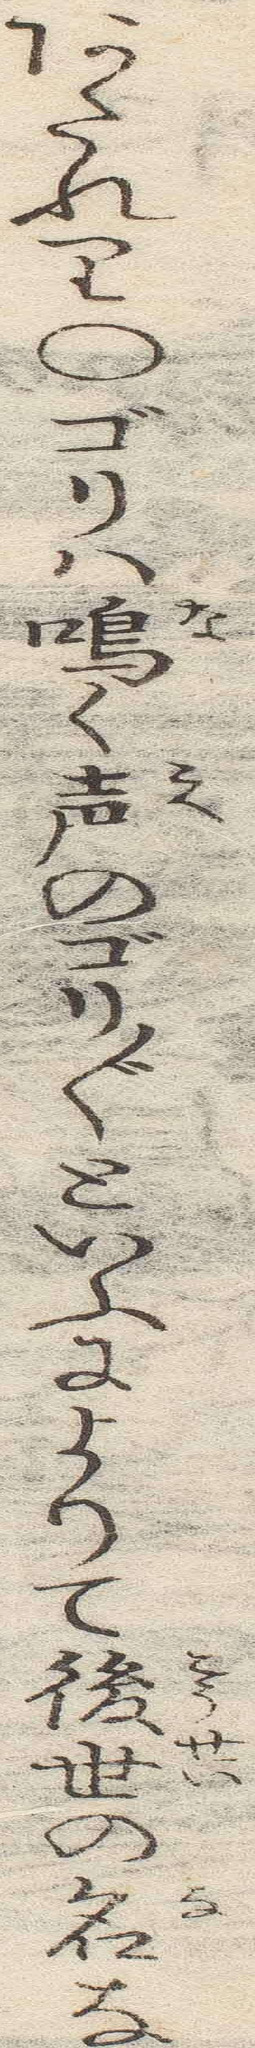あたれり○ゴリは鳴く声のゴリ〴〵といふによりて後世の名な
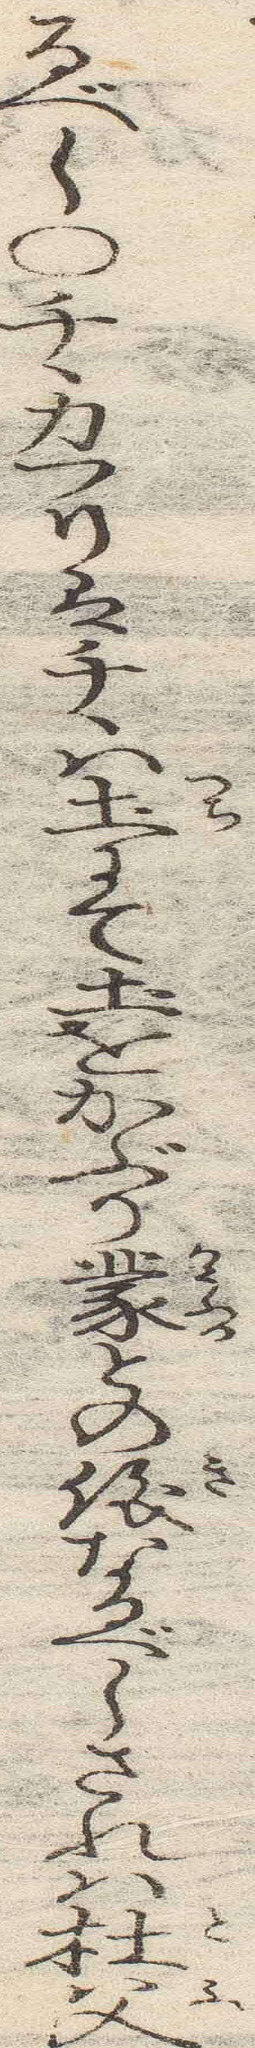るべし○チヽカフリはチヽは土にて土をかぶり蒙との儀なるべしされは杜父
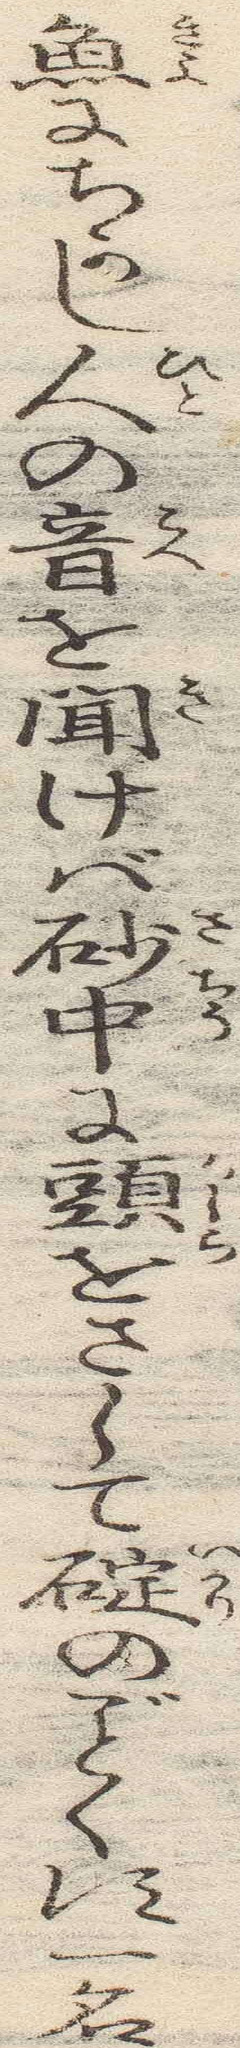魚にちかし人の音を聞けば砂中に頭をさして碇のごとくす一名
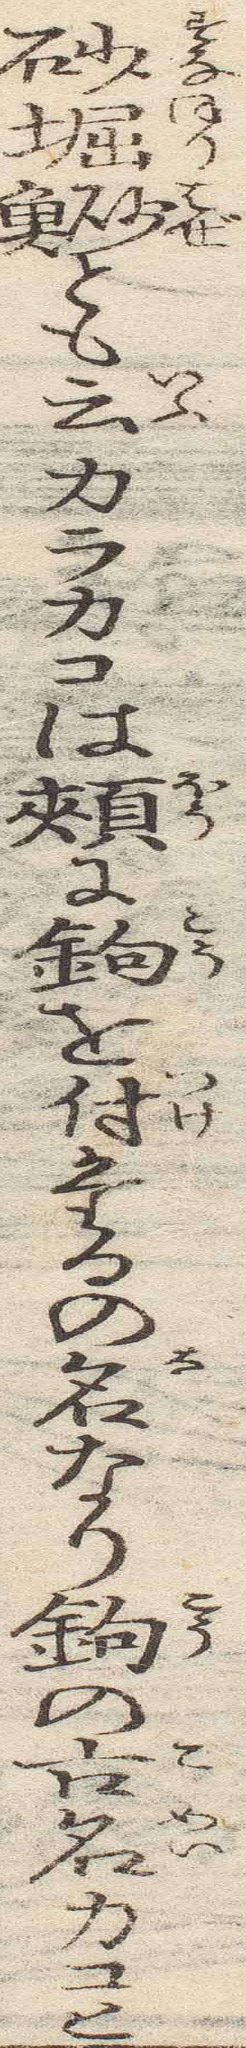砂堀鯋とも云カラカコは頬に鉤を付たるの名なり鉤の古名カコと
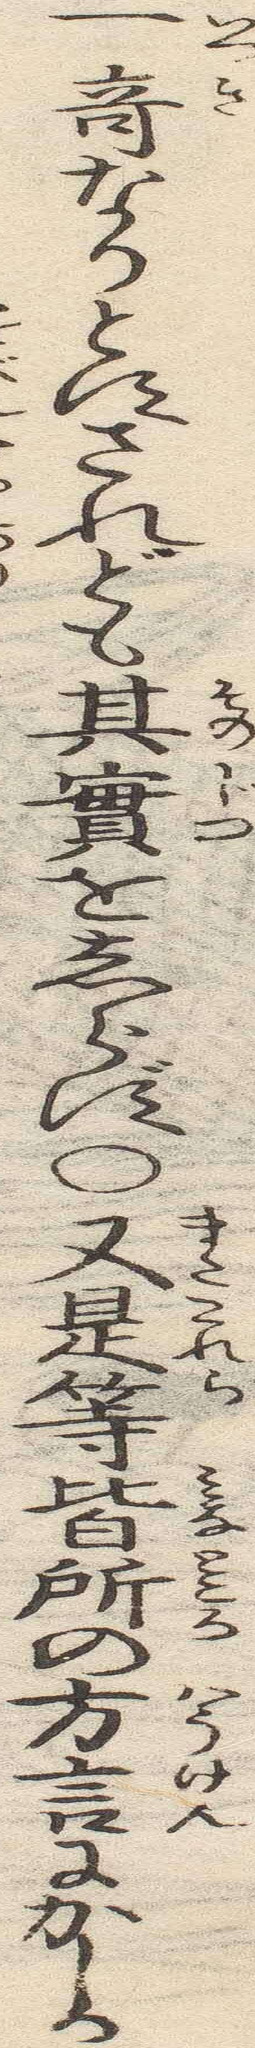一奇なりとすされども其実をしらず○又是等皆所の方言にかしか
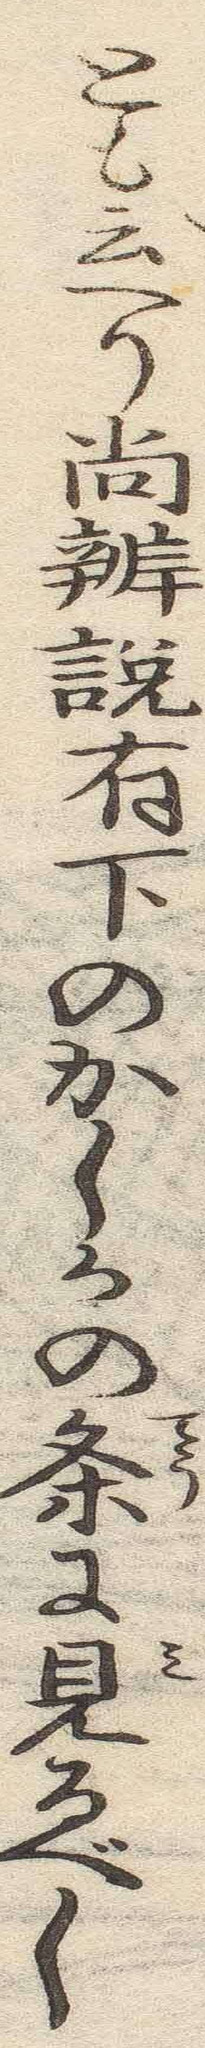とも云へり尚弁説有下のかしかの条に見るべし
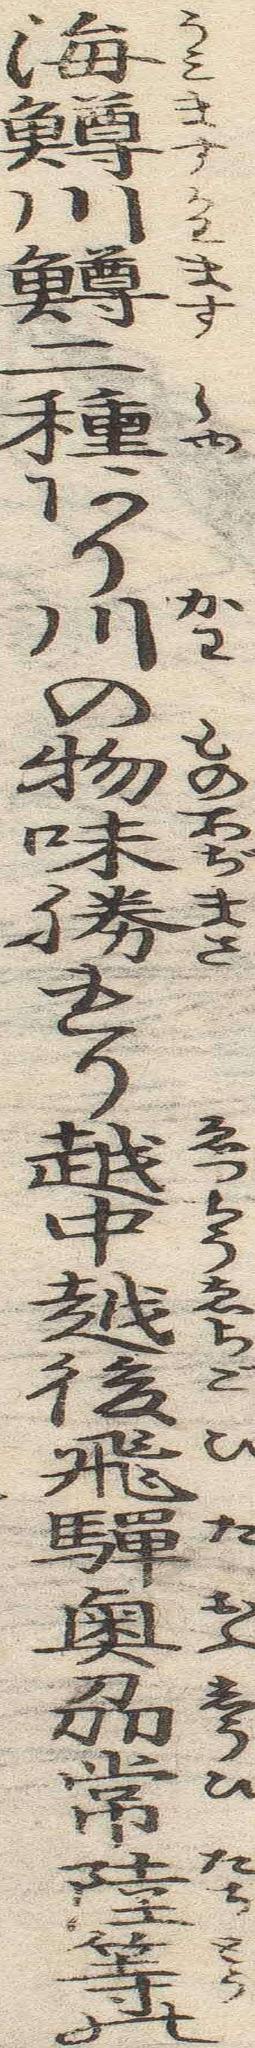海鱒川鱒二種あり川の物味勝れり越中越後飛騨奥州常陸等の
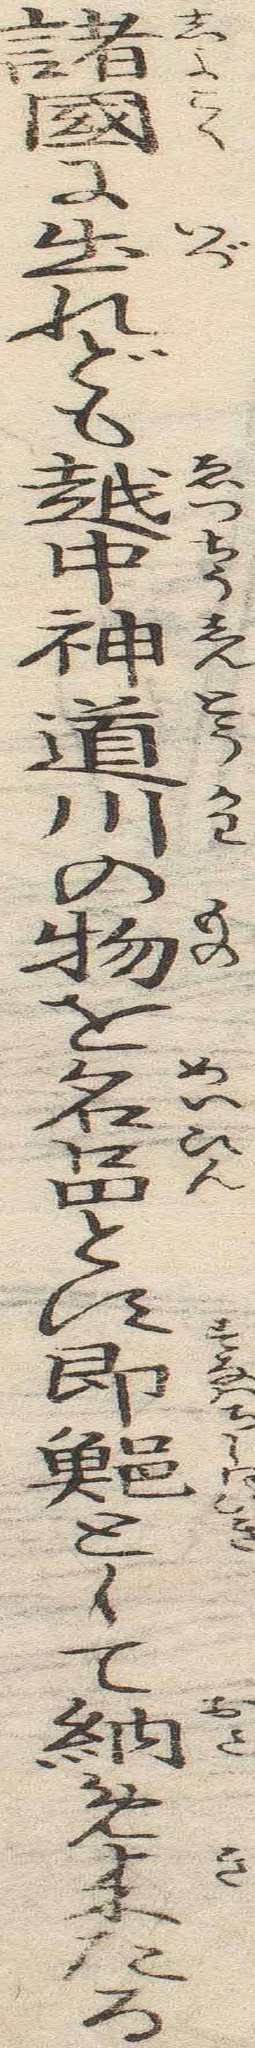諸国に出れども越中神道川の物を名品とす即䱒として納め来たる
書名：日本山海名産図会
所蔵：東京学芸大学附属図書館 国文学研究資料館
